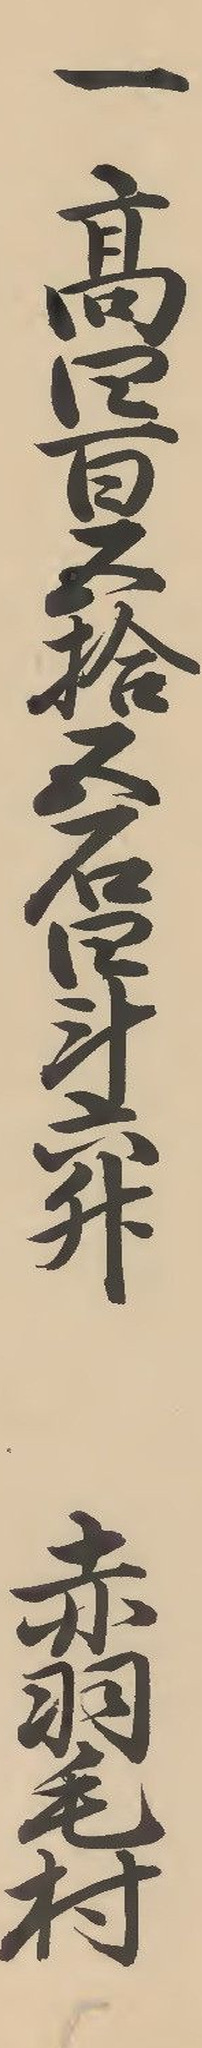一高四百五拾五石四斗六升赤羽毛村
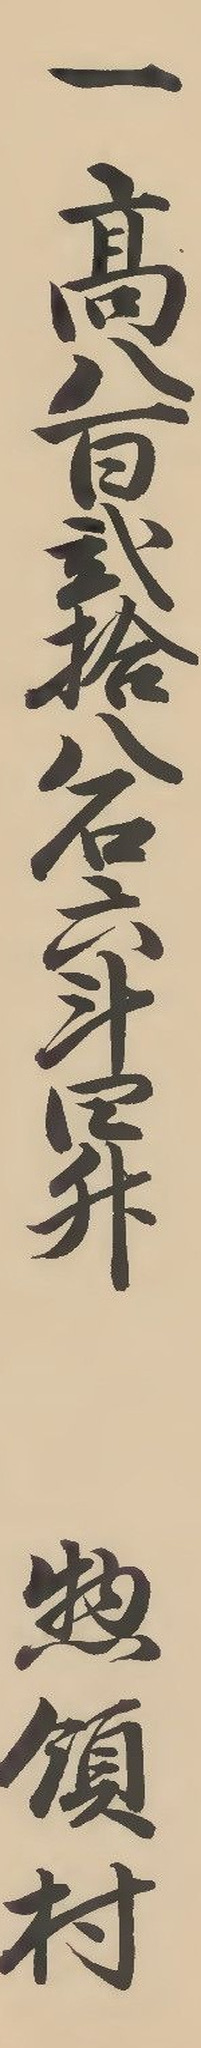一高八百弐拾八石六斗四升惣領村
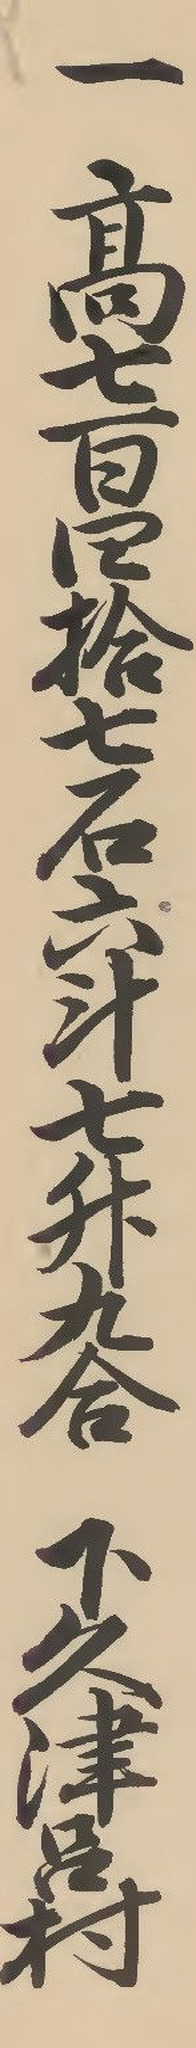一高七百四拾七石六斗七升九合下久津呂村

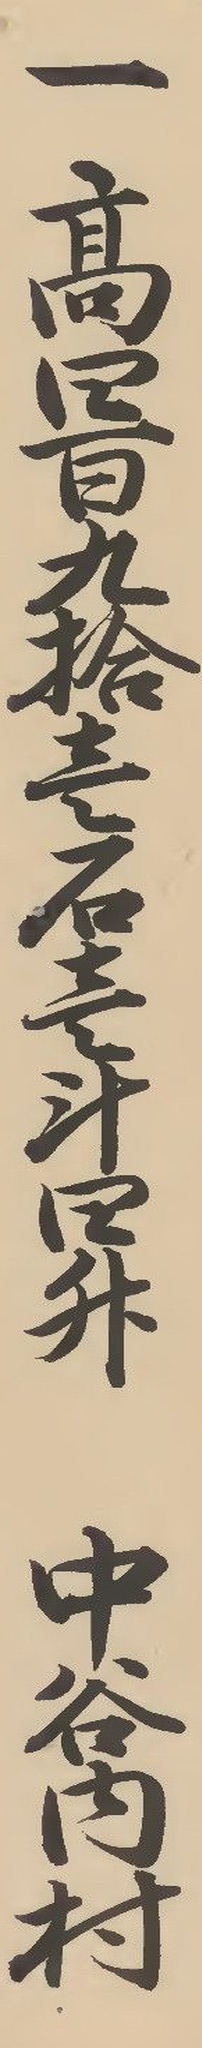一高四百九拾壱石壱斗四升中谷内村
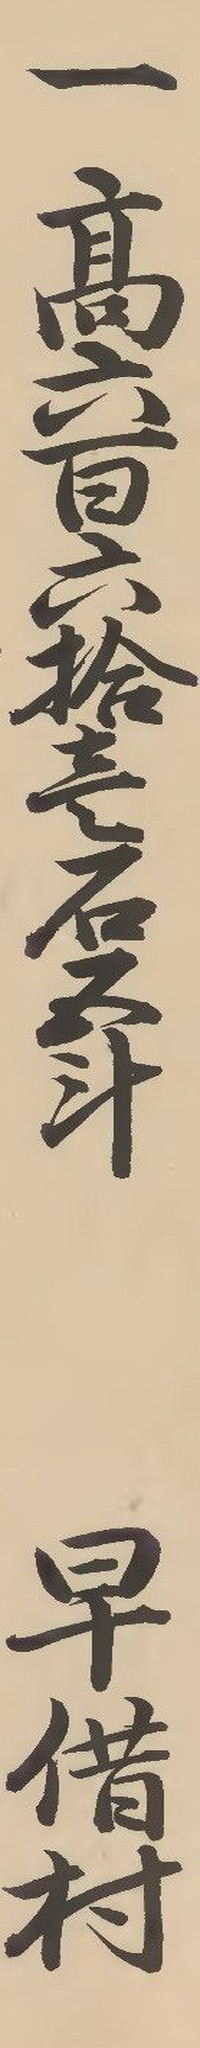一高六百六拾壱石五斗早借村
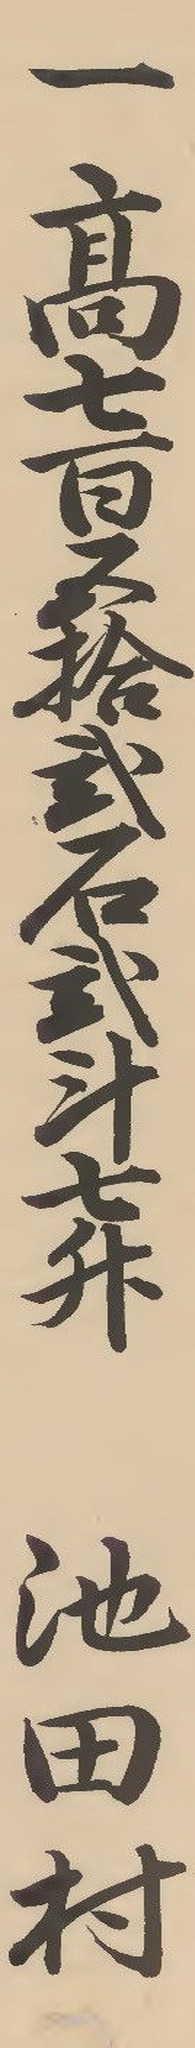一高七百五拾弐石弐斗七升池田村
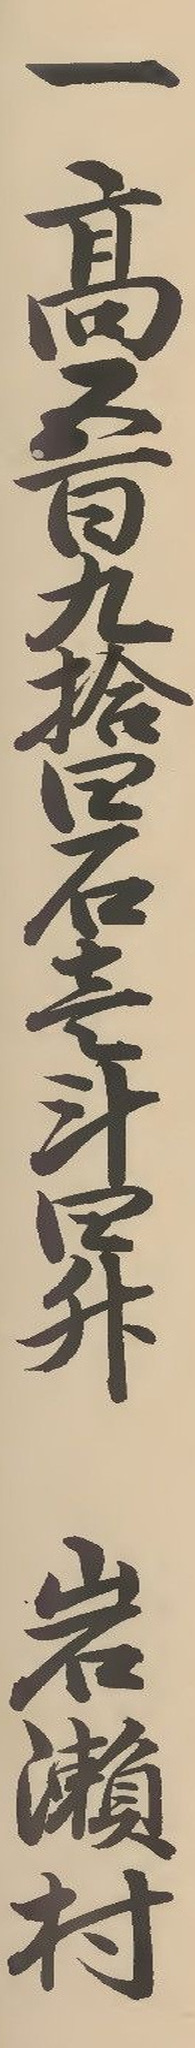一高五百九拾四石壱斗四升岩瀬村
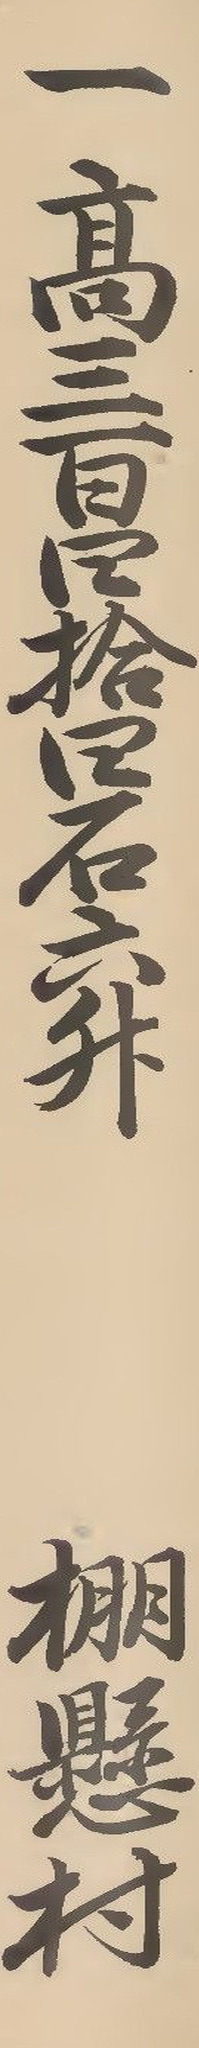一高三百四拾四石六升棚懸村
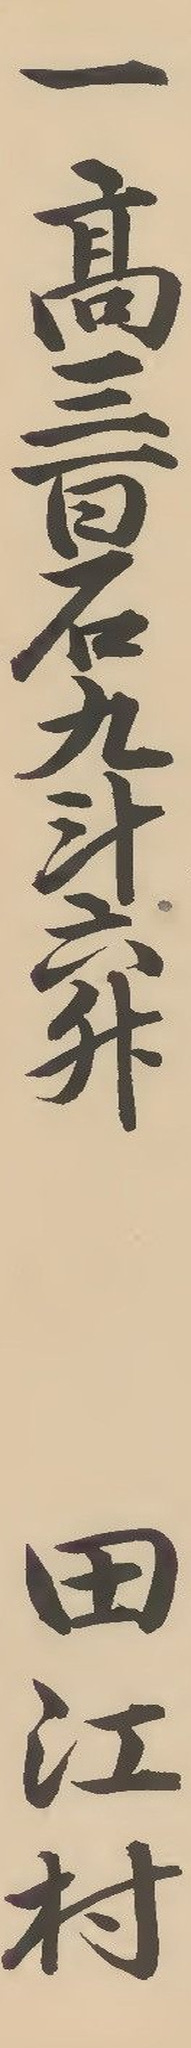一高三百石九斗六升田江村

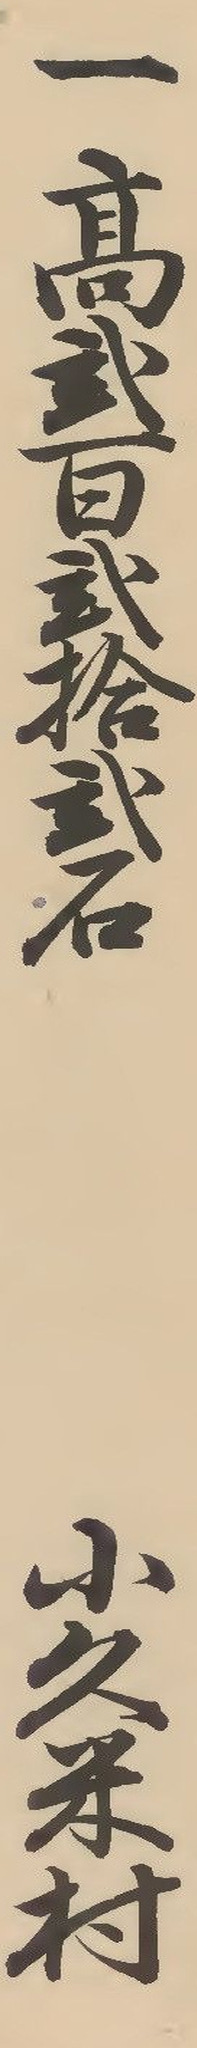一高弐百弐拾弐石小久米村
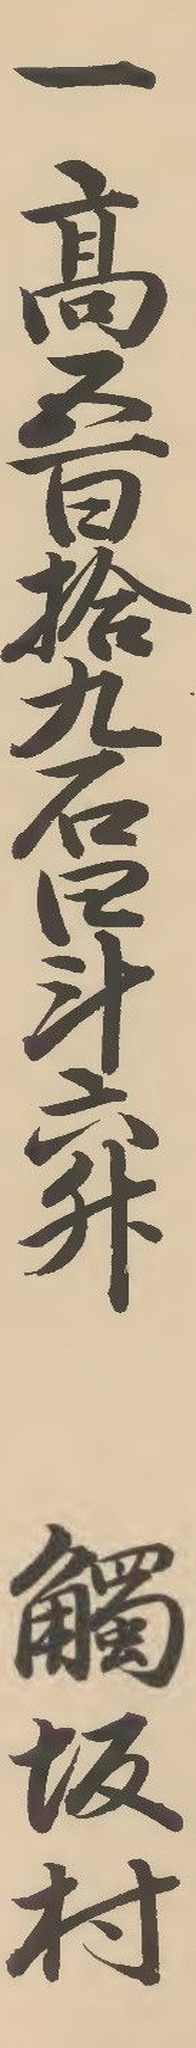一高五百拾九石四斗六升触坂村
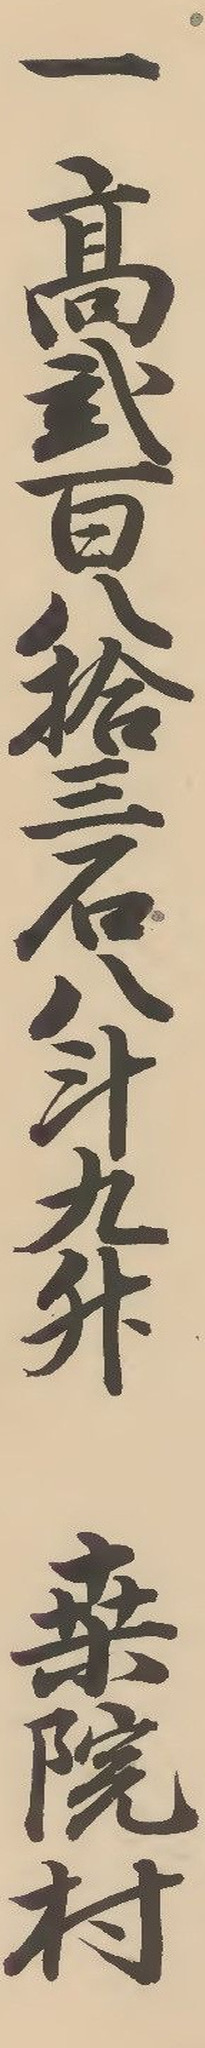一高弐百八拾三石八斗九升桑院村

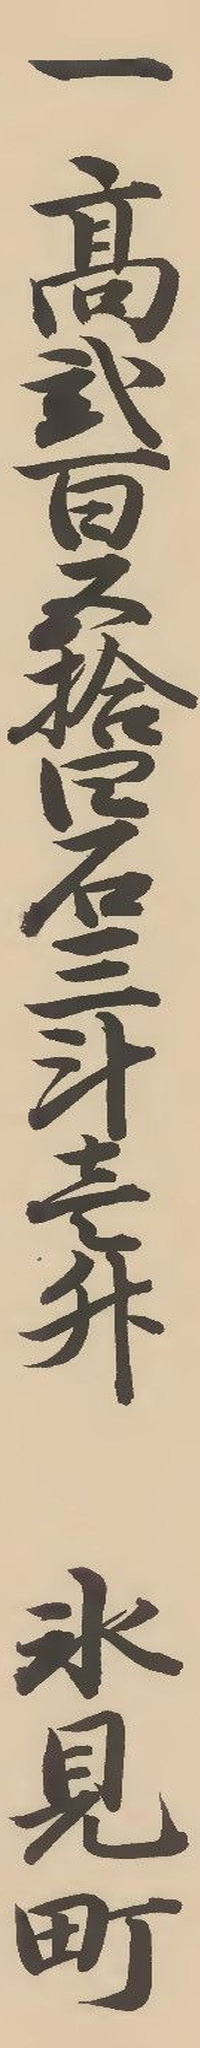一高弐百五拾四石三斗壱升氷見町
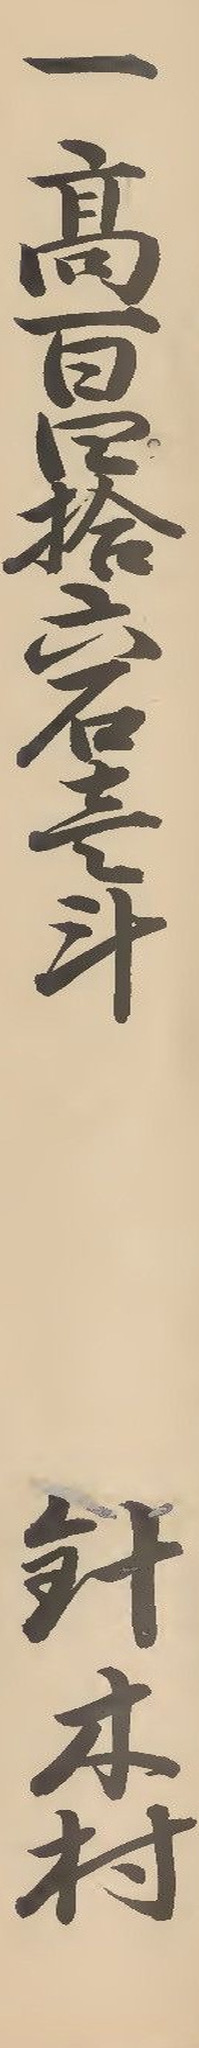一高百四拾六石壱斗針木村

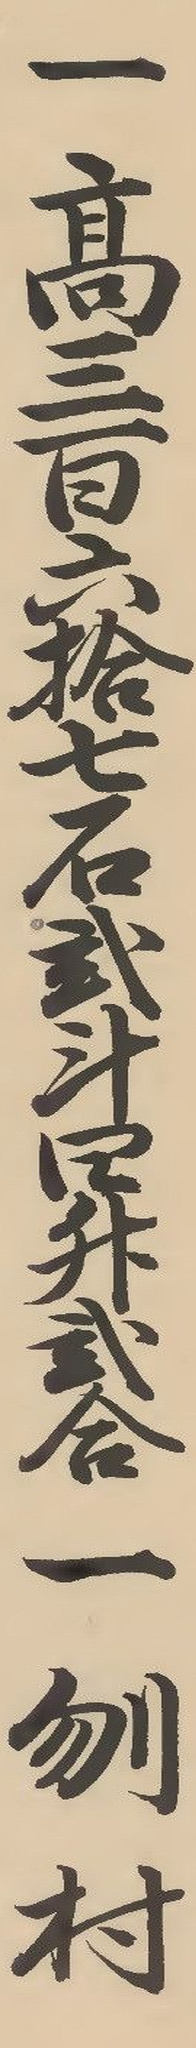一高三百六拾七石弐斗四升弐合一刎村
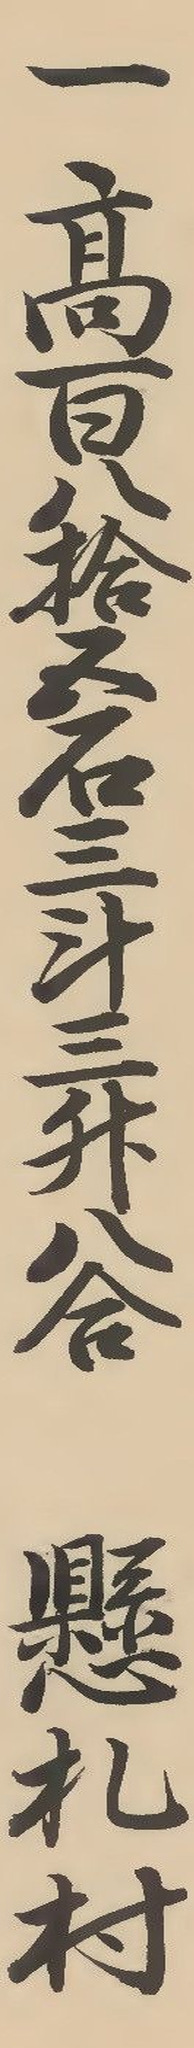一高百八拾五石三斗三升八合懸札村
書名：越中国郷帳
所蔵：国立公文書館 National Archives of Japan
